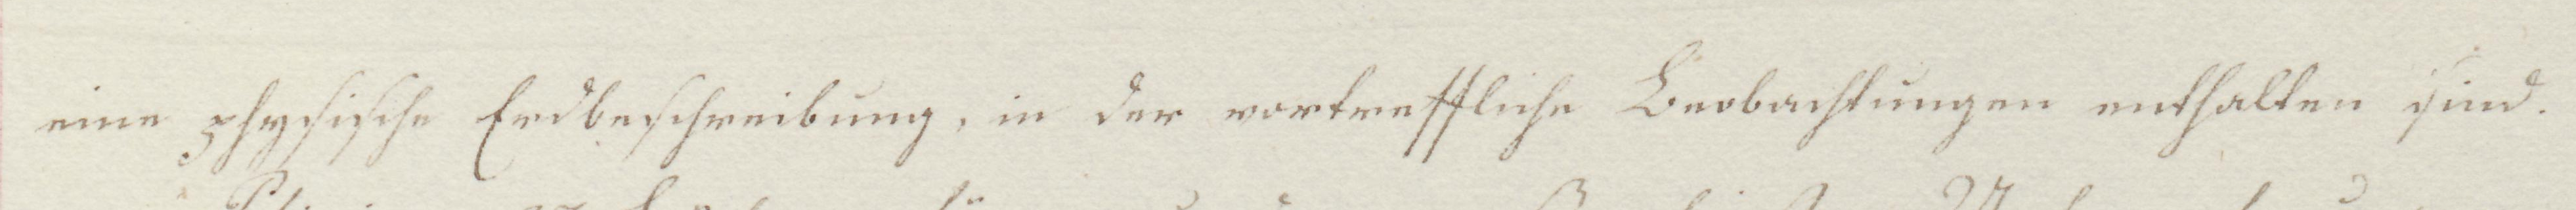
eine physische Erdbeschreibung, in der vortreffliche Beobachtungen enthalten sind.
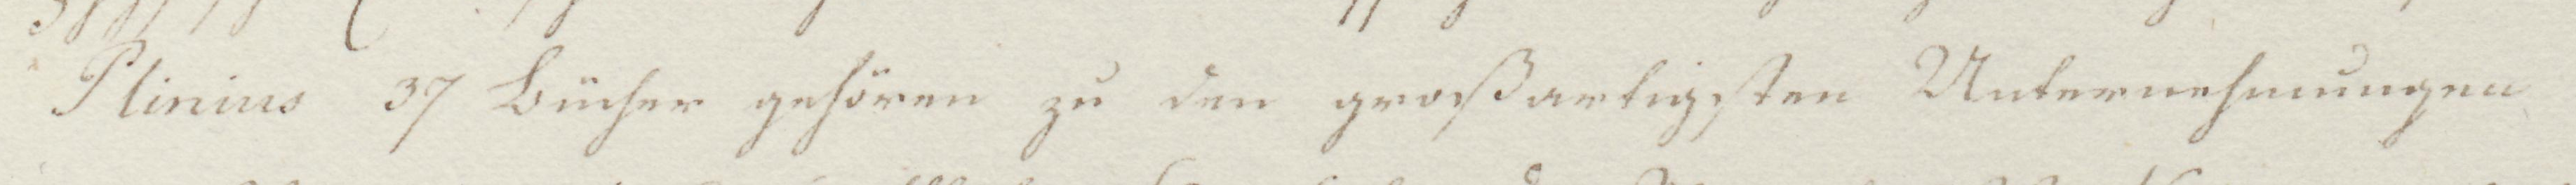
Plinius 37 Bücher gehören zu den großartigsten Unternehmungen
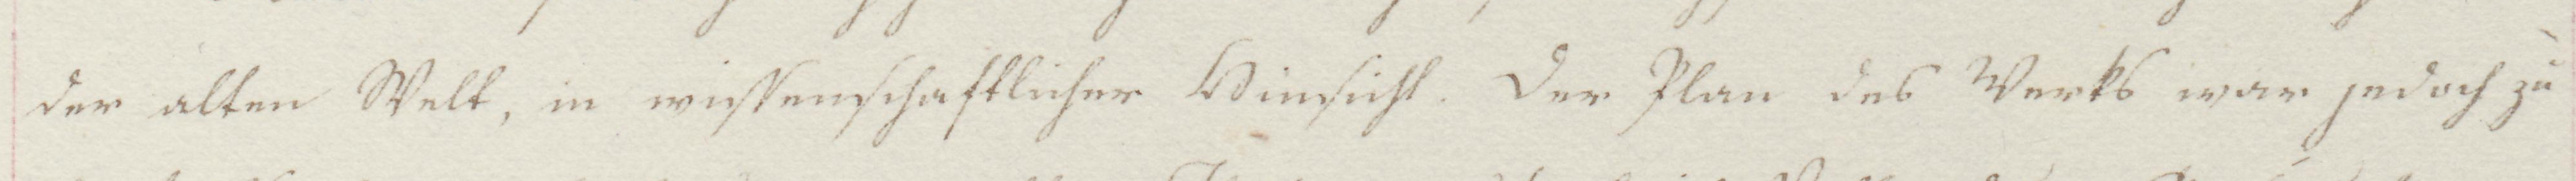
der alten Welt, in wissenschaftlicher Hinsicht. Der Plan des Werks war jedoch zu
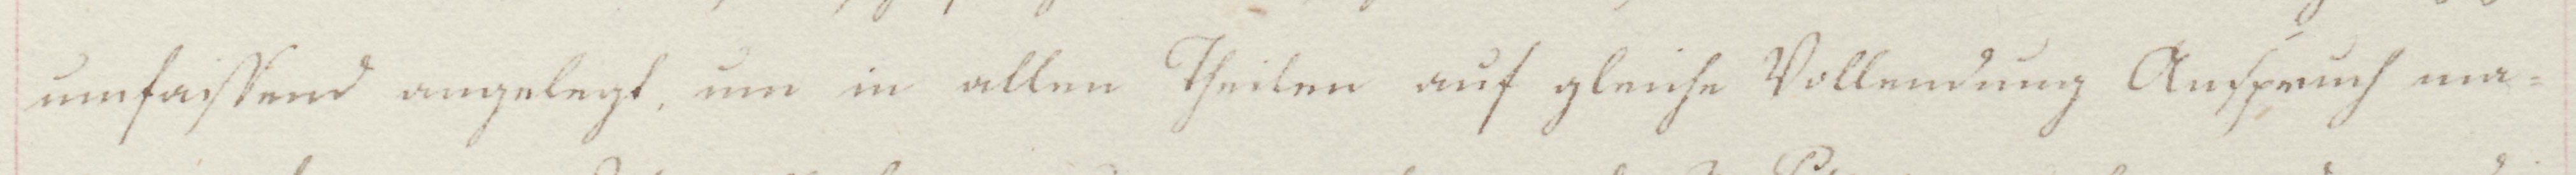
umfassend angelegt, um in allen Theilen auf gleiche Vollendung Anspruch ma-
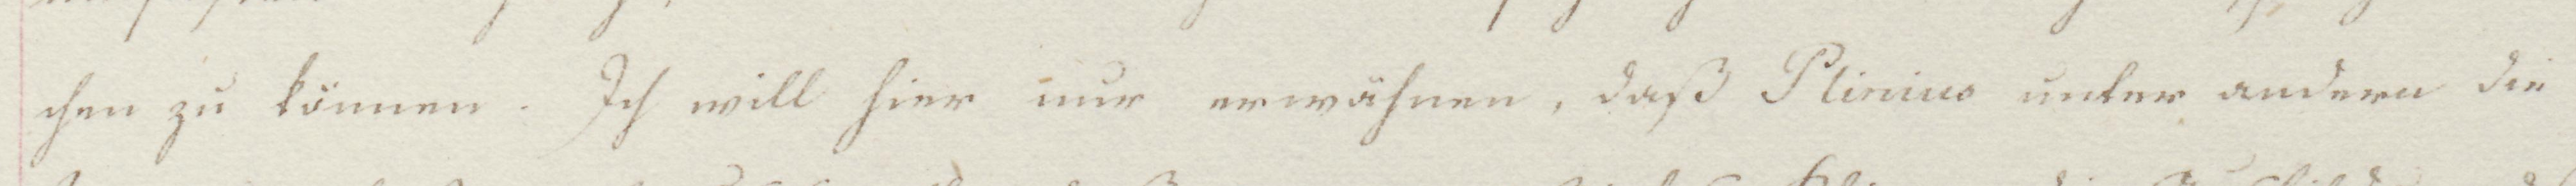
chen zu können. Ich will hier nur erwähnen, daß Plinius unter andern die
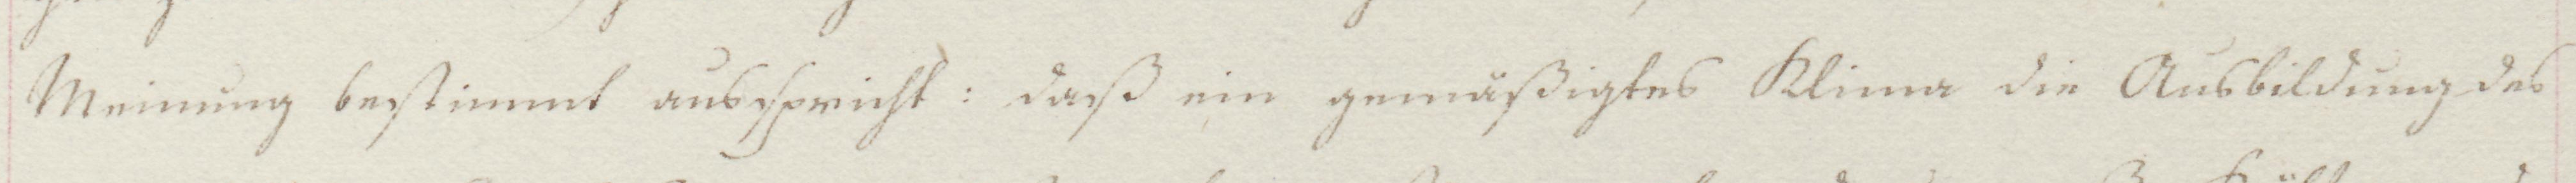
Meinung bestimmt ausspricht: daß ein gemäßigtes Klima die Ausbildung des
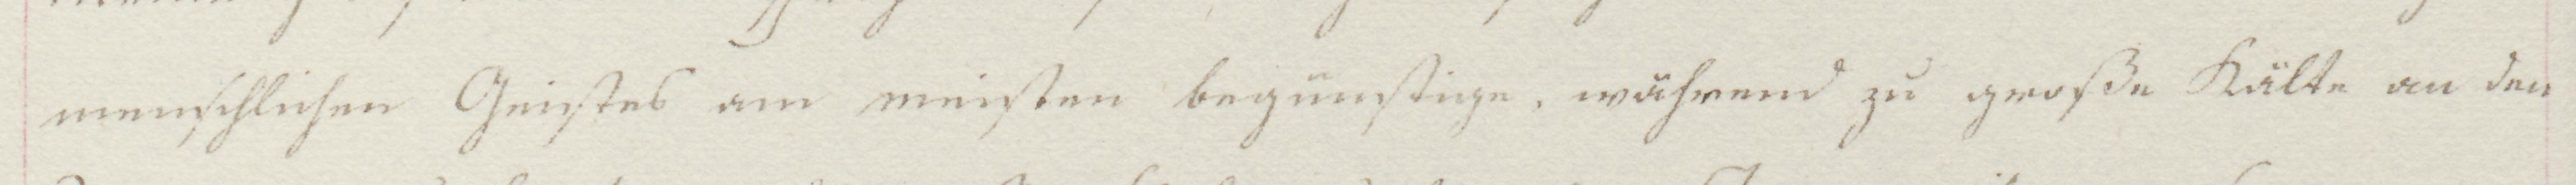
menschlichen Geistes am meisten begünstige, während zu große Kälte an den
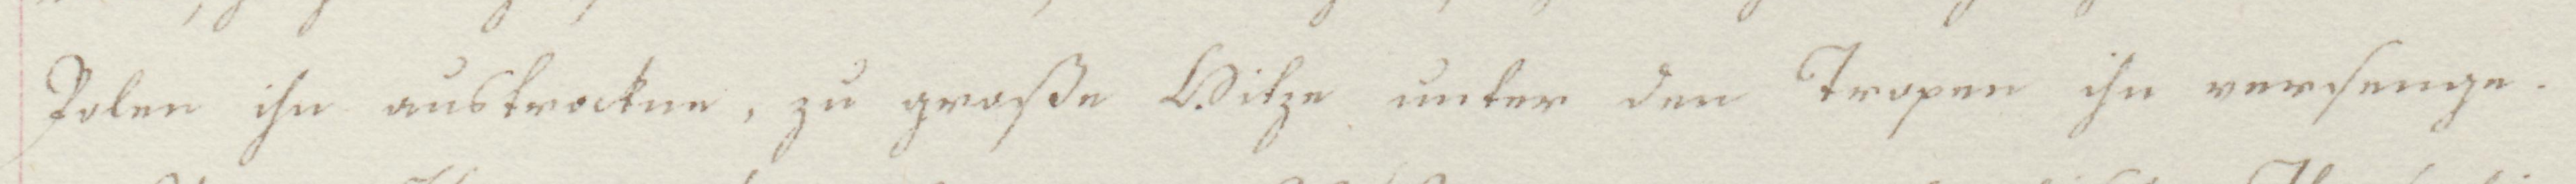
Polen ihn austrockne, zu große Hitze unter den Tropen ihn versenge.
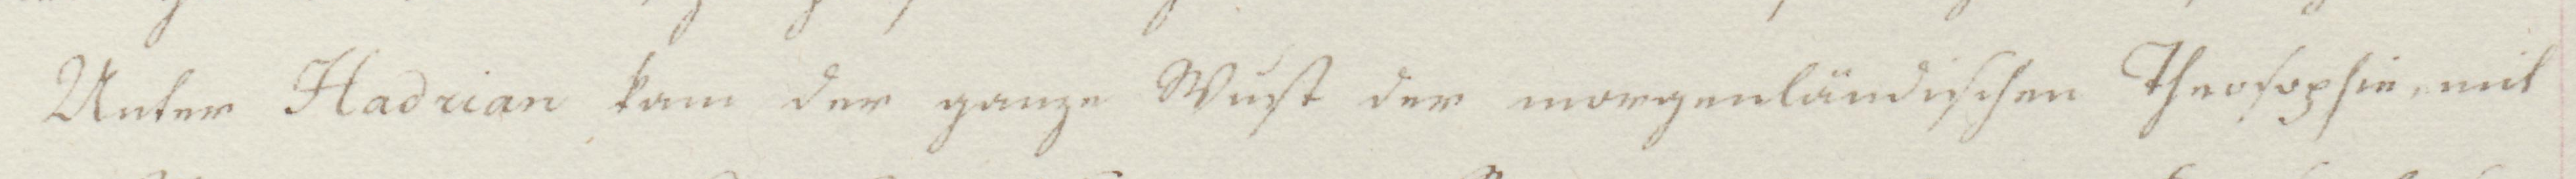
Unter Hadrian kam der ganze Wust der morgenländischen Theosophie, mit
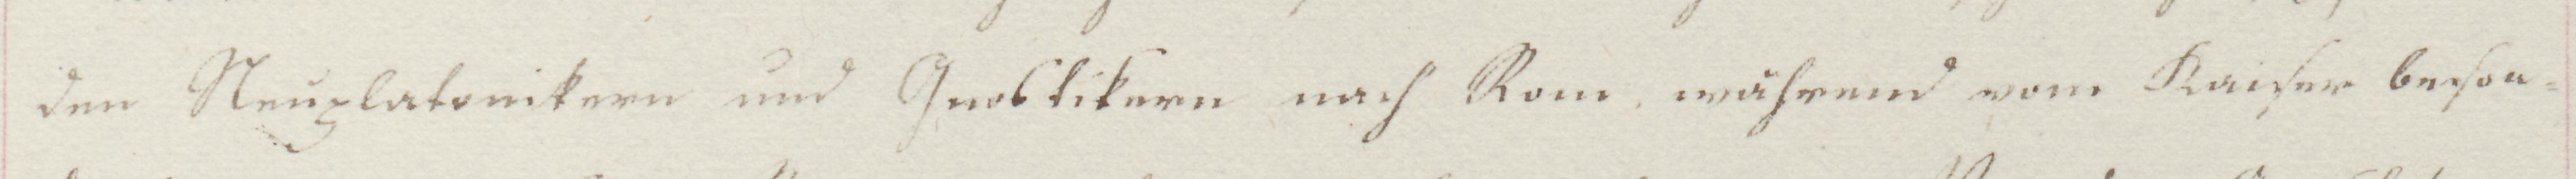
den Neuplatonikern und Gnostikern nach Rom, während vom Kaiser beson-
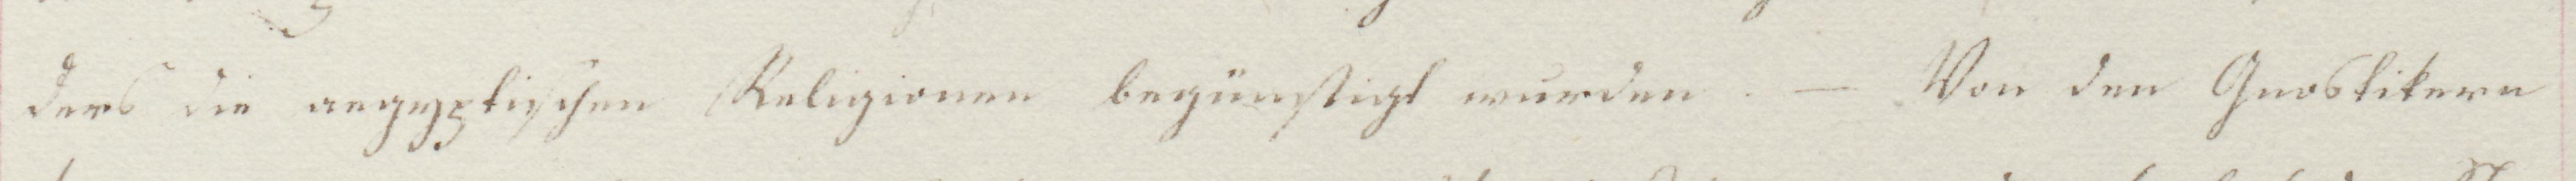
ders die aegyptischen Religionen begünstigt wurden. – Von den Gnostikern
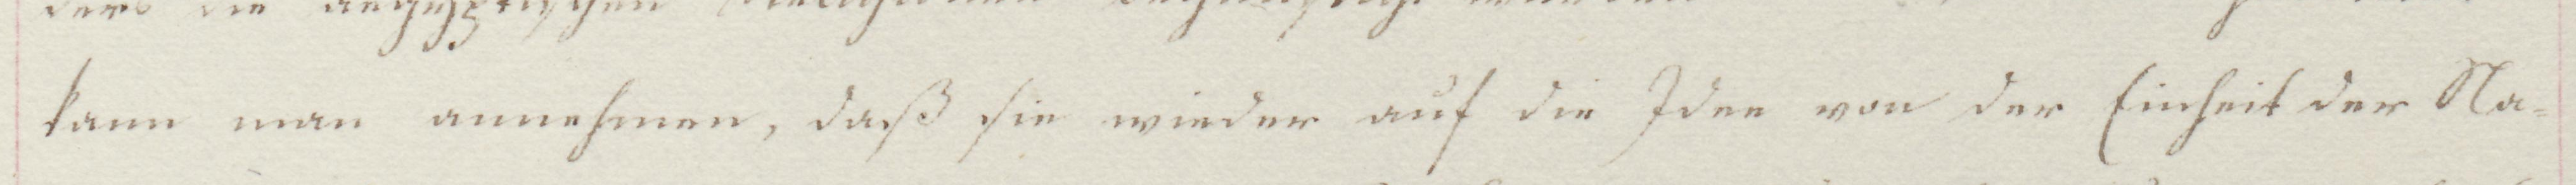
kann man annehmen, daß sie wieder auf die Idee von der Einheit der Na-
